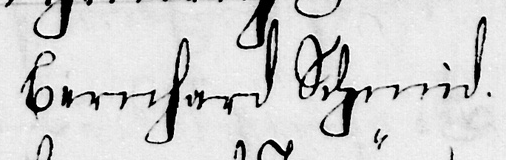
Bernhard Schmid.
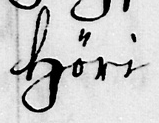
Höri
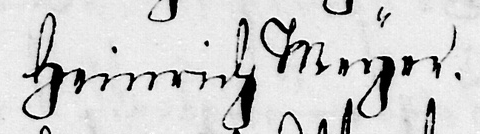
Heinrich Meyer.
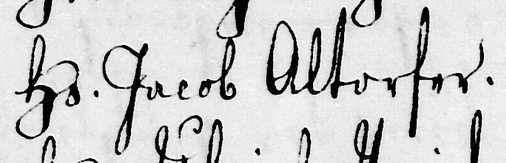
Hs. Jacob Altorfer.
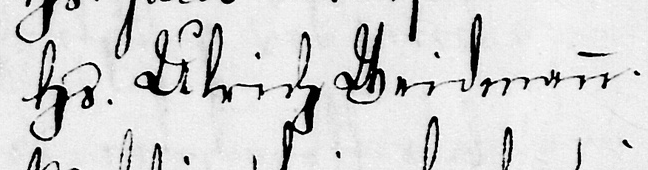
Hs. Ulrich Weidmann.
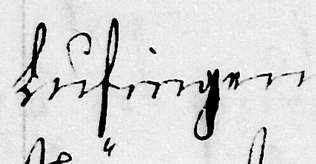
Lufingen
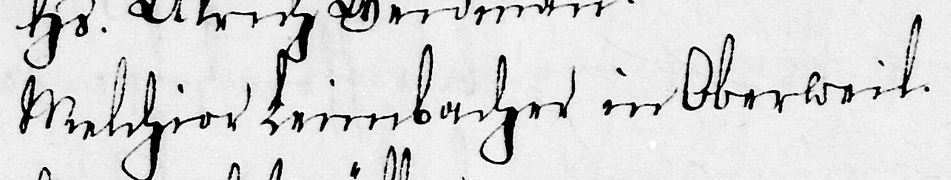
Melchior Leimbacher in Oberweil.
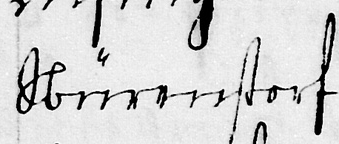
Nürenstorf
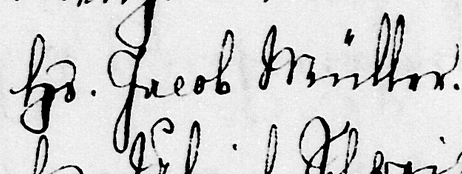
Hs. Jacob Müller.
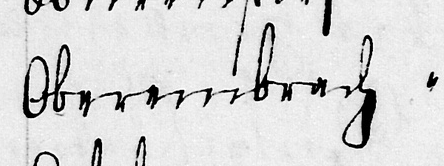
Oberembrach
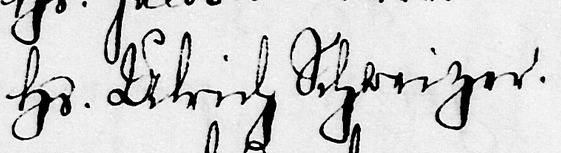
Hs. Ulrich Schweizer.
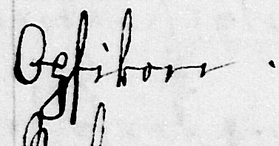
Opfikon
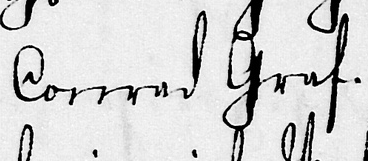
Conrad Graf.
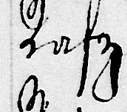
Rafz
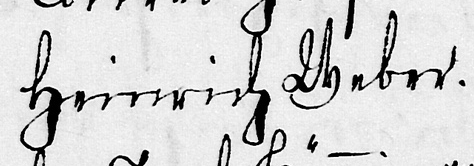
Heinrich Weber.
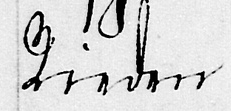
Rieden
